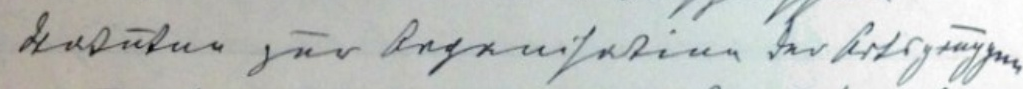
Statuten zur Organisation der Ortsgruppen
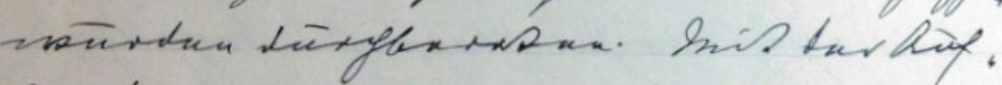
wurden durchberaten. Mit der Auf
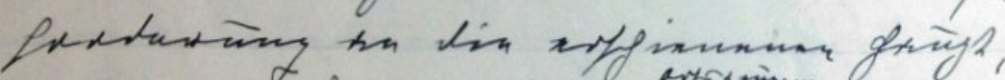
forderung an die erschienenen Haupt
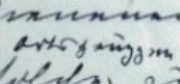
Ortgruppen
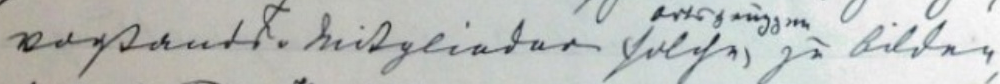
vorstands-Mitglieder solche zu bilden
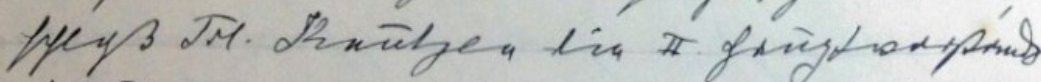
schloß Frl. Knutzen die II. Hauptvorstands
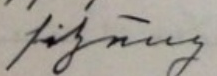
sitzung.
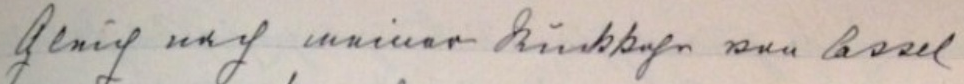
Gleich nach meiner Rückkehr von Cassel
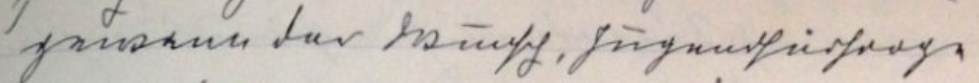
gewann der Wunsch Jugenführsorege
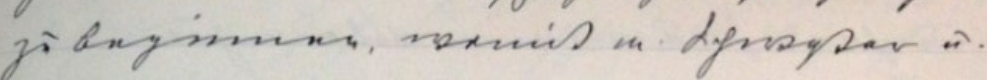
zu beginnen, womit m. Schwester u.
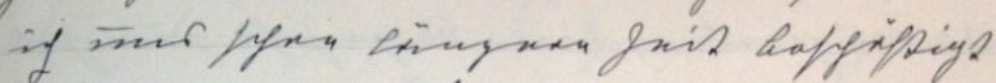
ich uns schon längere Zeit beschäftigt
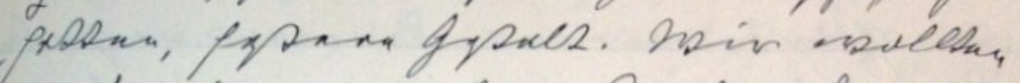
beschäftigt hatten, festere Gestalt. Wir wollten
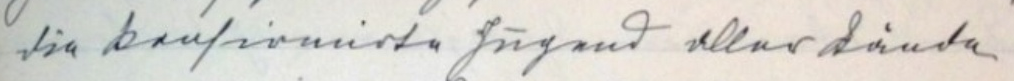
die konfirmierte Jugend aller Stände
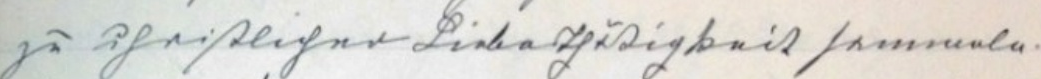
Stände zu christlicher Liebesthätigkeit sammeln.
